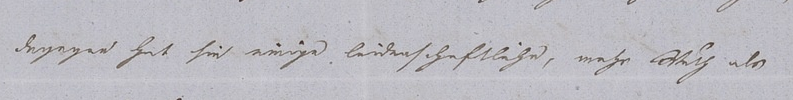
dagegen hat sie einige leidenschaftliche, mehr Wuth als
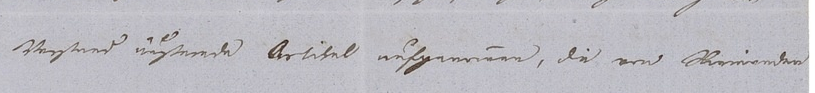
Verstand äußernde Artikel aufgenommen, die von Niemandem
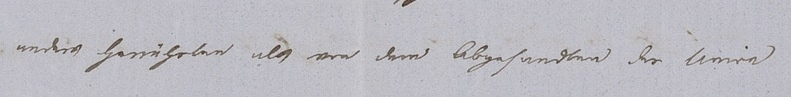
anders herrührten als von dem Abgesandten der Union
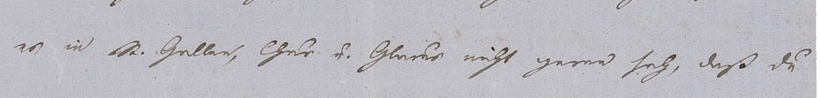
es in St. Gallen, Chur u. Glarus nicht gerne sah, daß Du
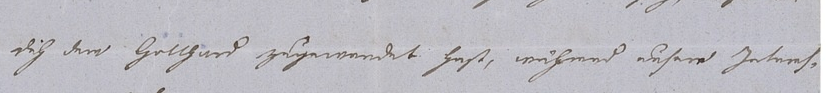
Dich dem Gotthard zugewendet hast, während unsere Interes-
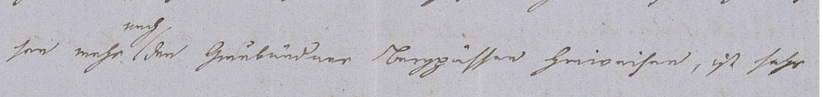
mehr nach den Graubündner Bergpässen hinweisen, ist sehr
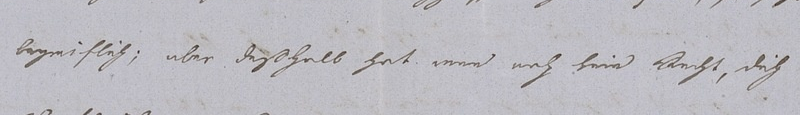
begreiflich; aber deßhalb hat man noch kein Recht, Dich
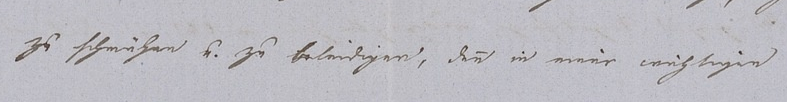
zu schmähen u. zu beleidigen, denn in einer wichtigen
